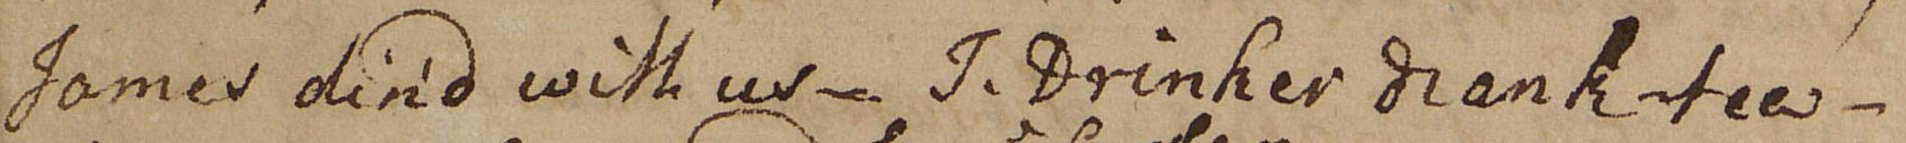James din'd with us- I. Drinker drank tea-
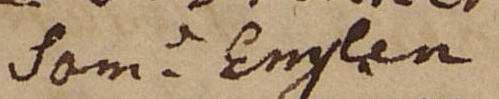Sam^l. Emlen
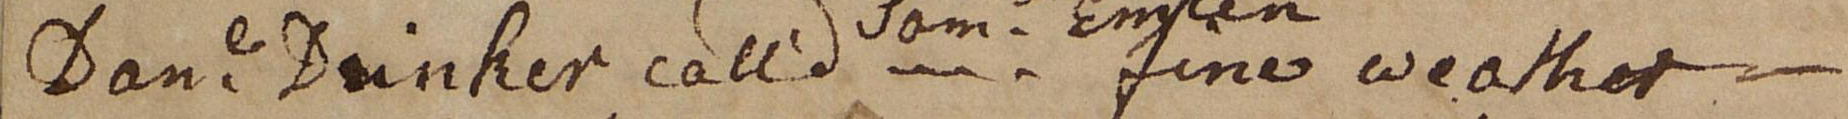Dan^l. Drinker call'd- fine weather -
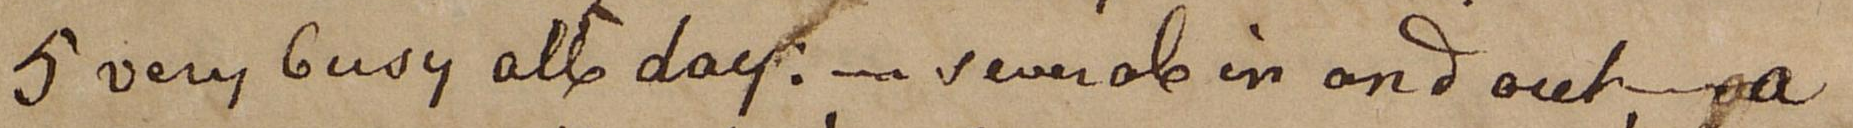5 very busy all day:- several in and out, a
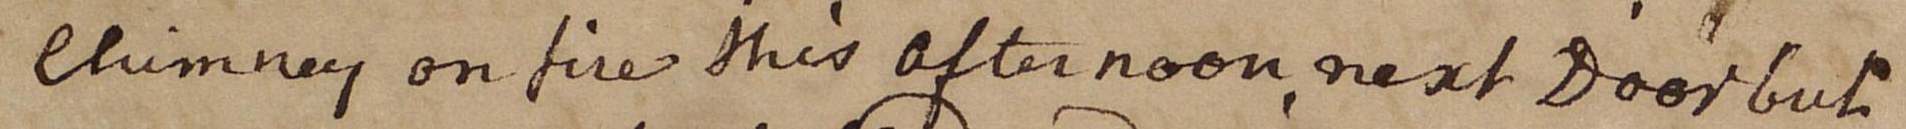Chimney on fire this afternoon, next Door but
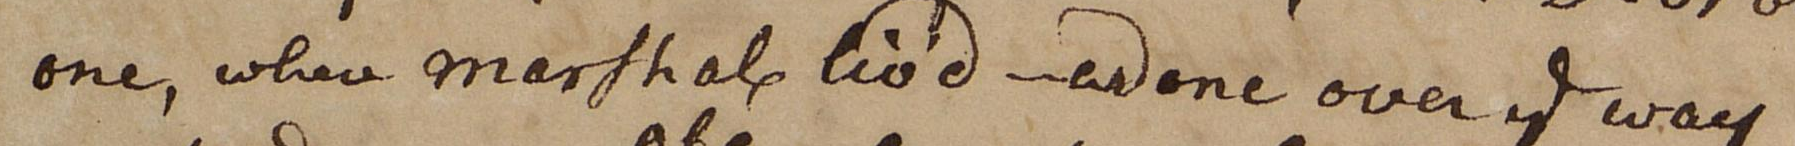one, where marshal liv'd- as one over y^e way
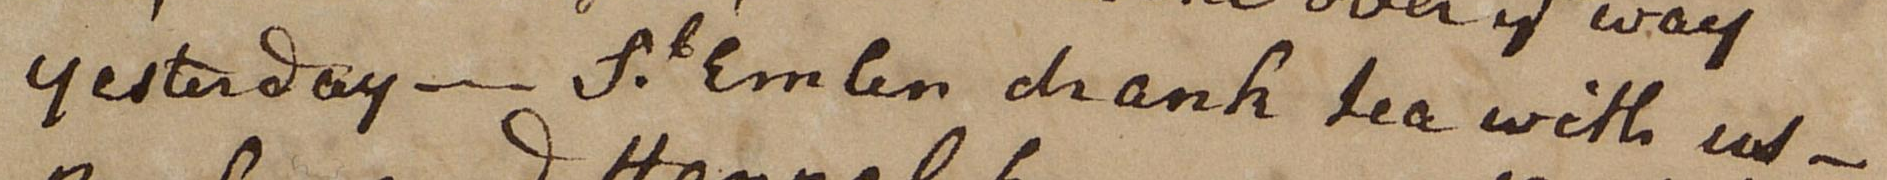yesterday- S^l. Emlen drank tea with us-
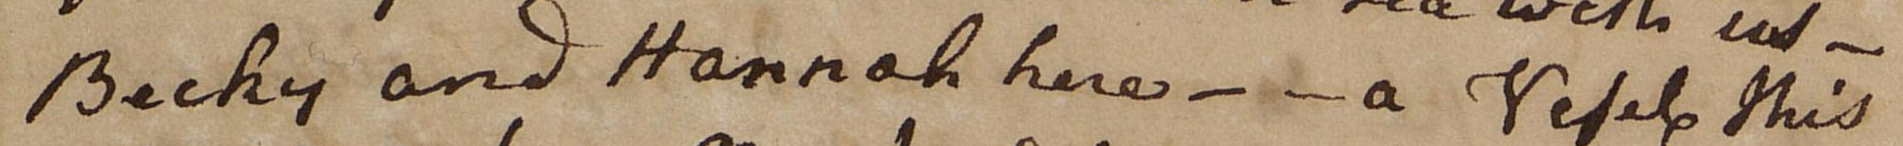Becky and Hannah here-- a Vesel this
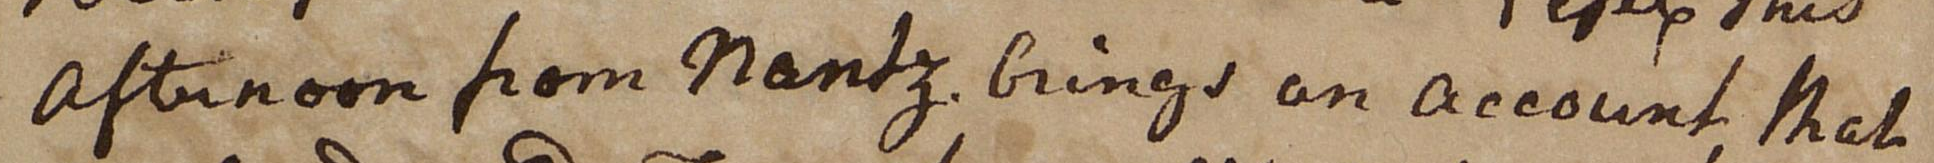afternoon from Nantz. brings on account, that
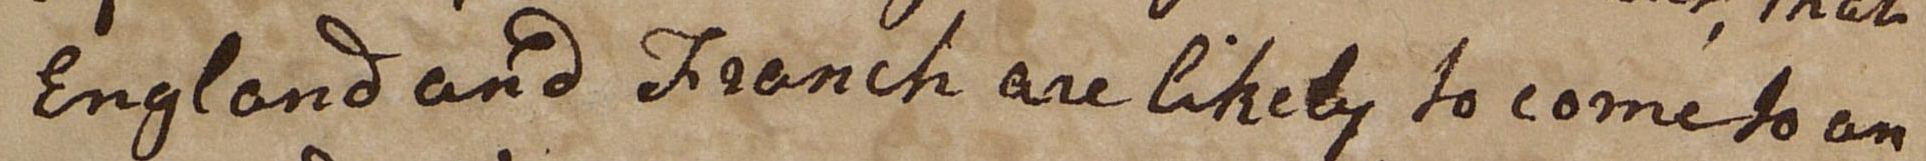England and French are likely to come to an
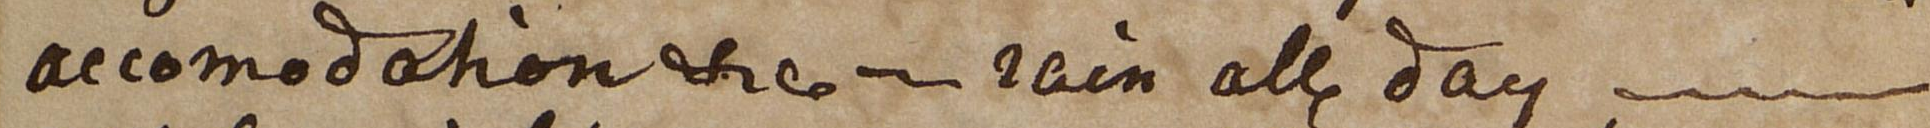accomodation &c- rain all day-
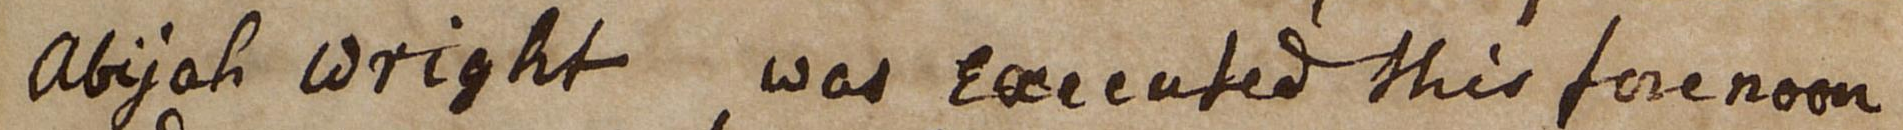Abijah Wright was Executed this forenoon
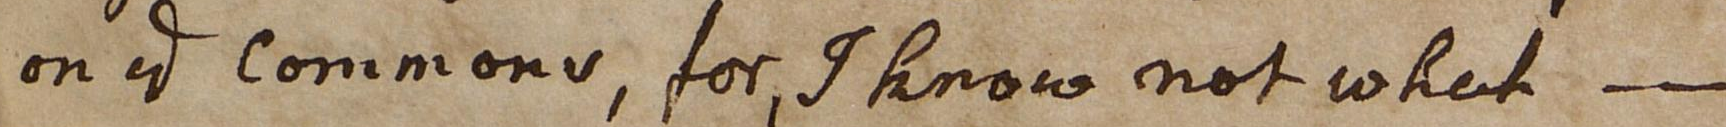on y^e Commons, for, I know not what-
